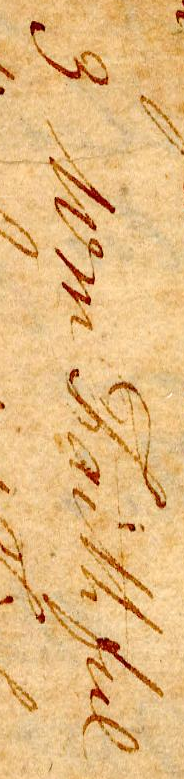3 W^m Faithful
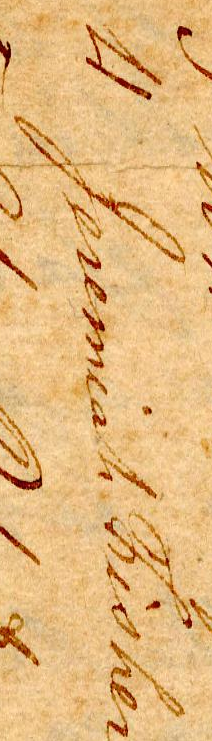4 Jeremiah Fisher
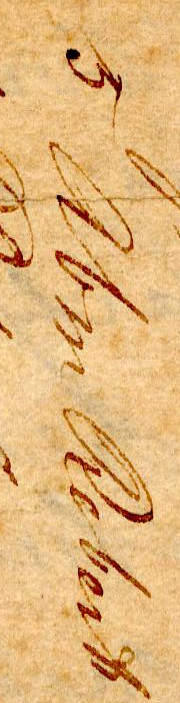5 Abm Robert
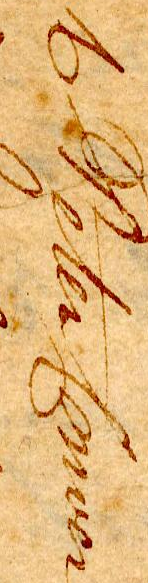6 Peter Conner
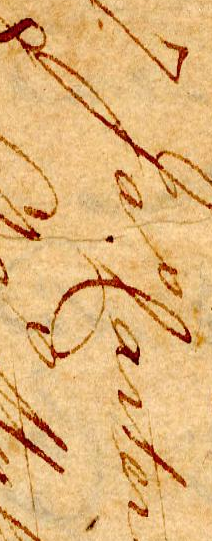7 Ja^s. Carter
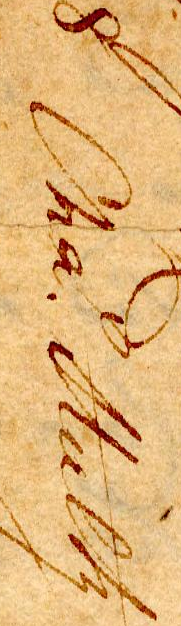8 Cha^s. Stulty
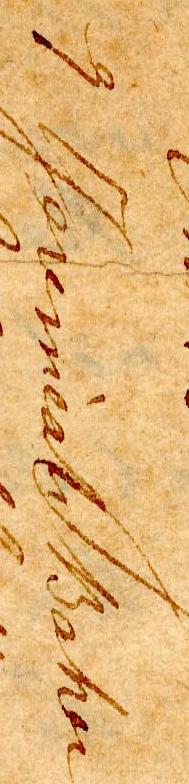9 Jeremiah Baker
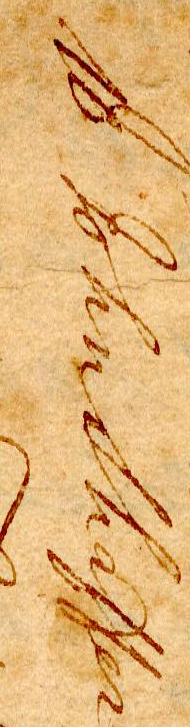10 John Shaffer
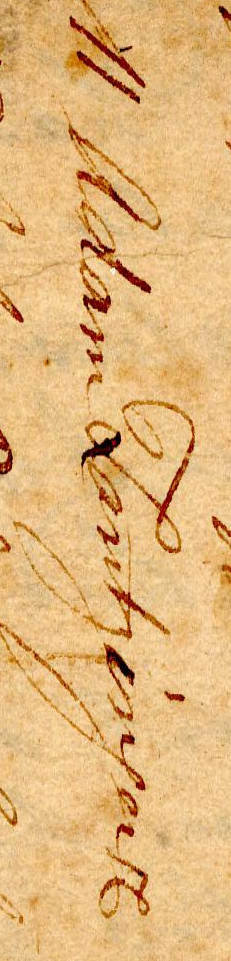11 Adam Lanzinger
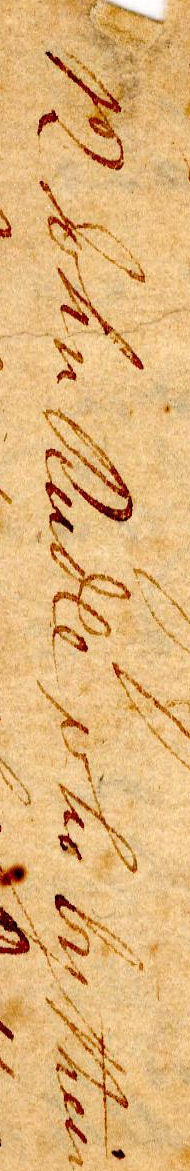12 John Rudle who by their
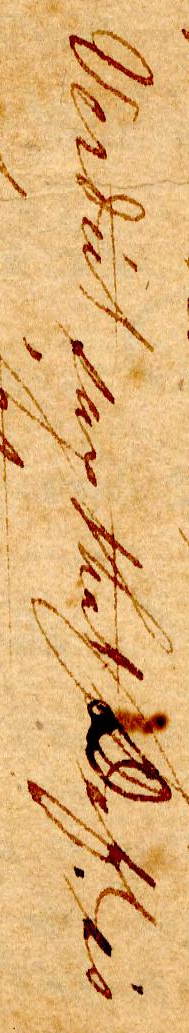Verdict say that Def^t is
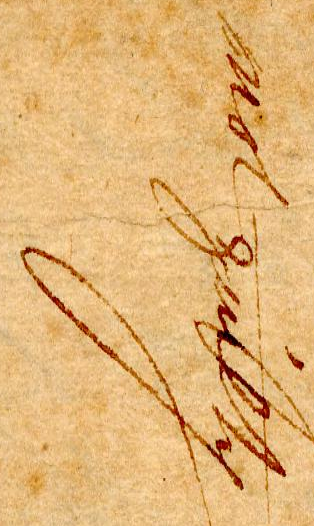not guilty
